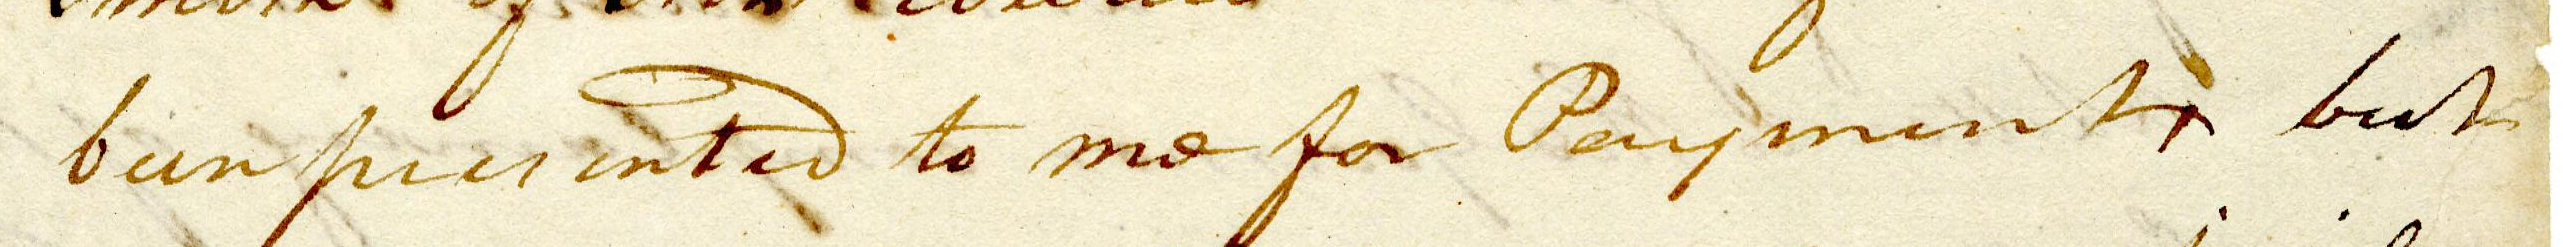been presented to me for Payments but
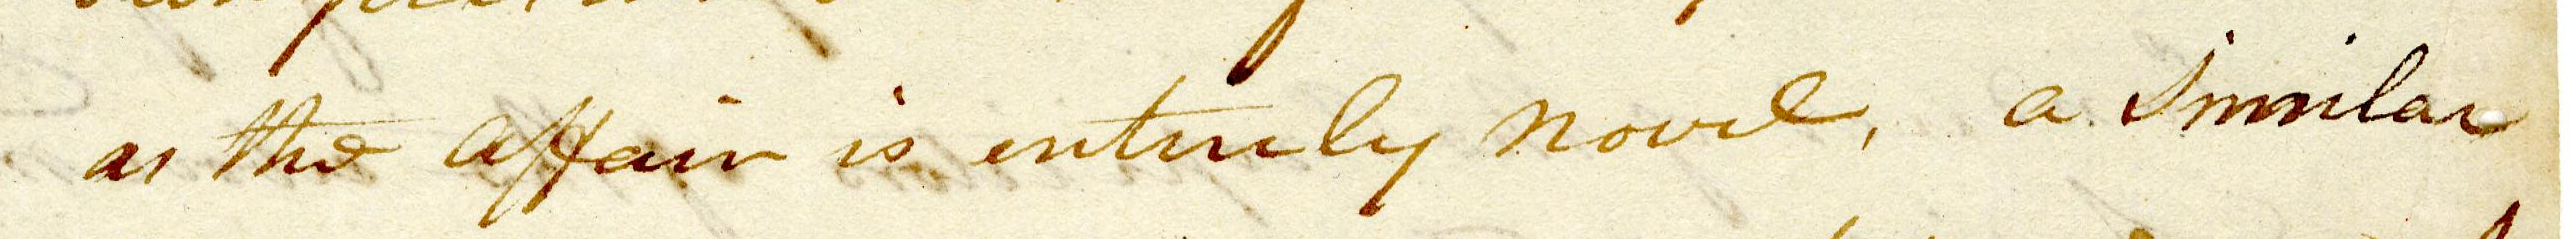as the affair is entirely novel, a Similar
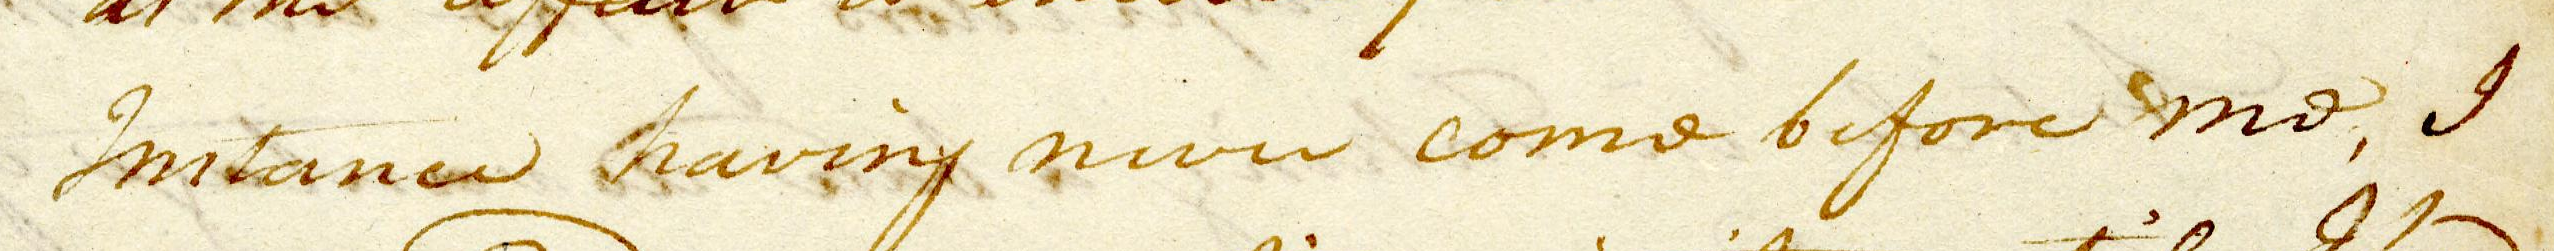Instance having never come before me, I
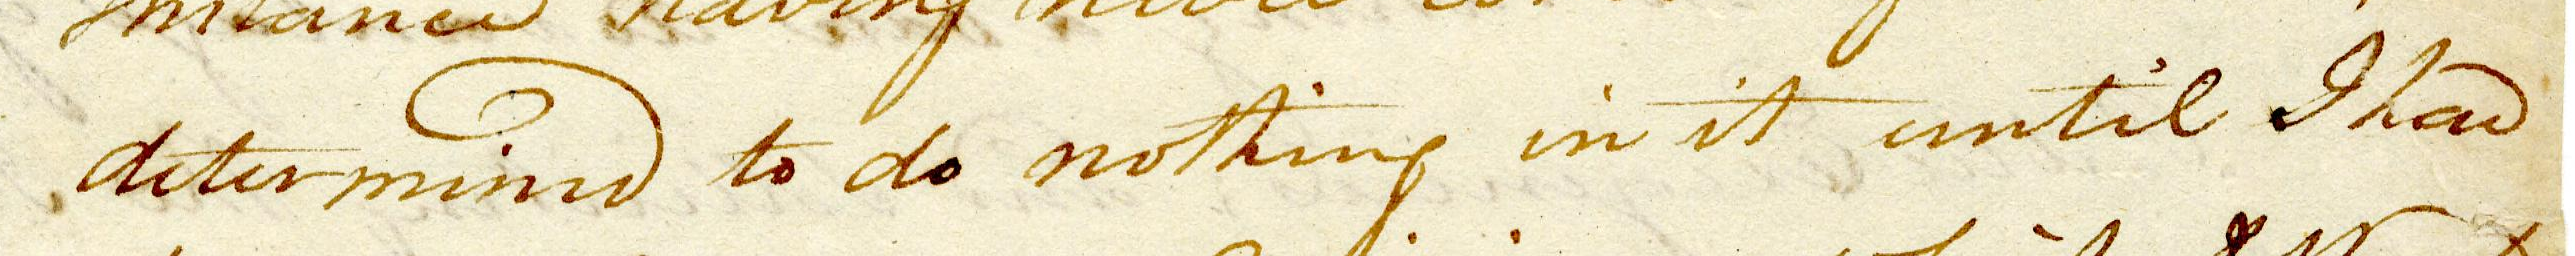determind to do nothing in it until I had
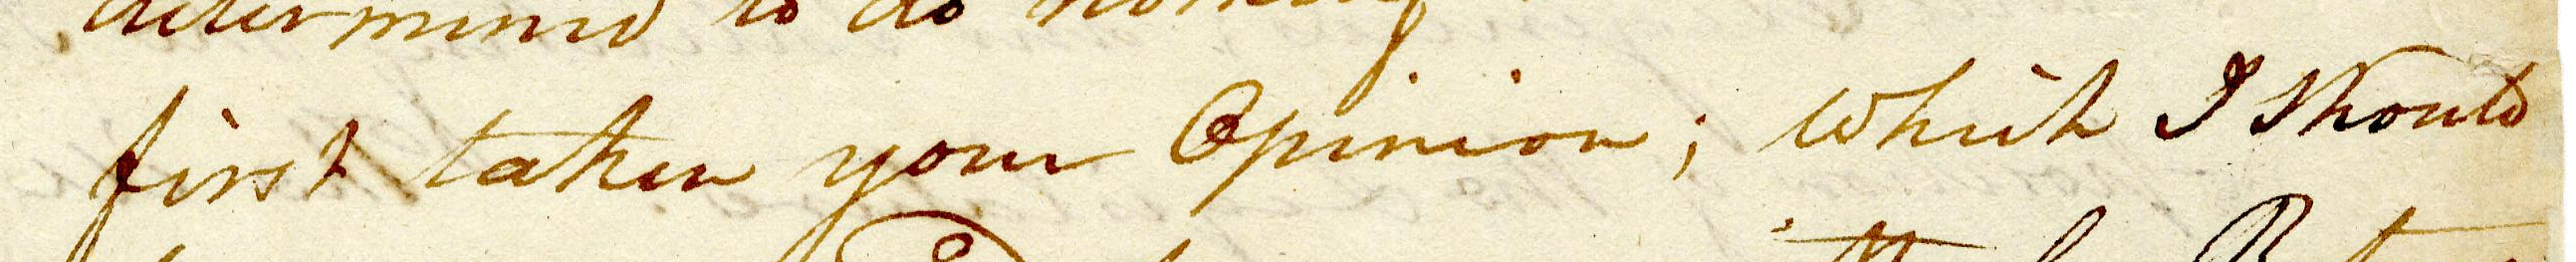first taken your Opinion; which I should
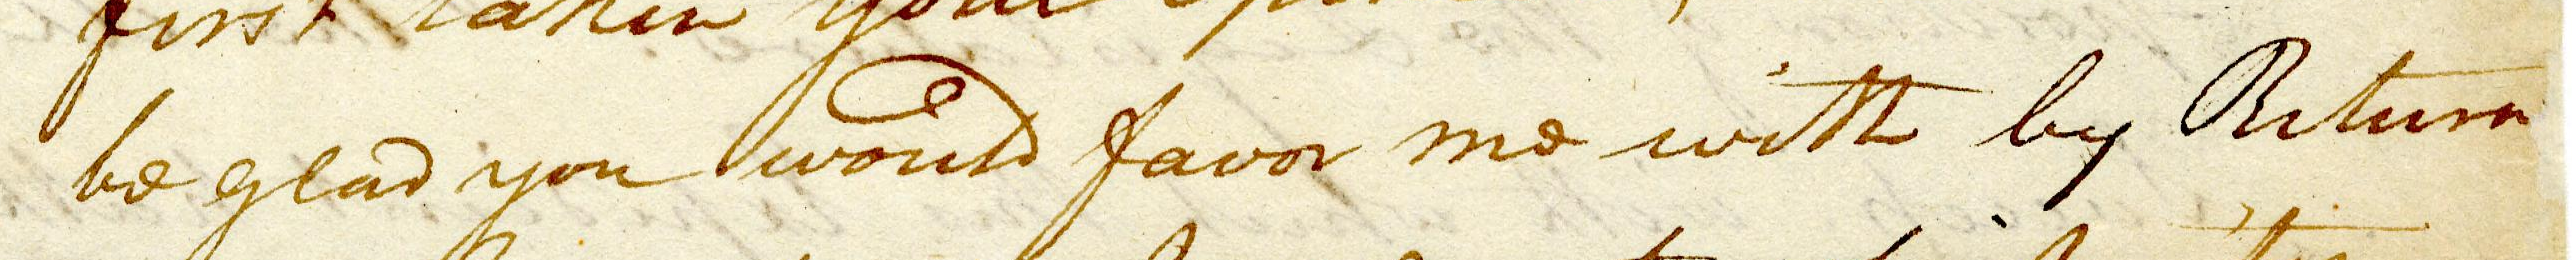be glad you would favor me with by Return
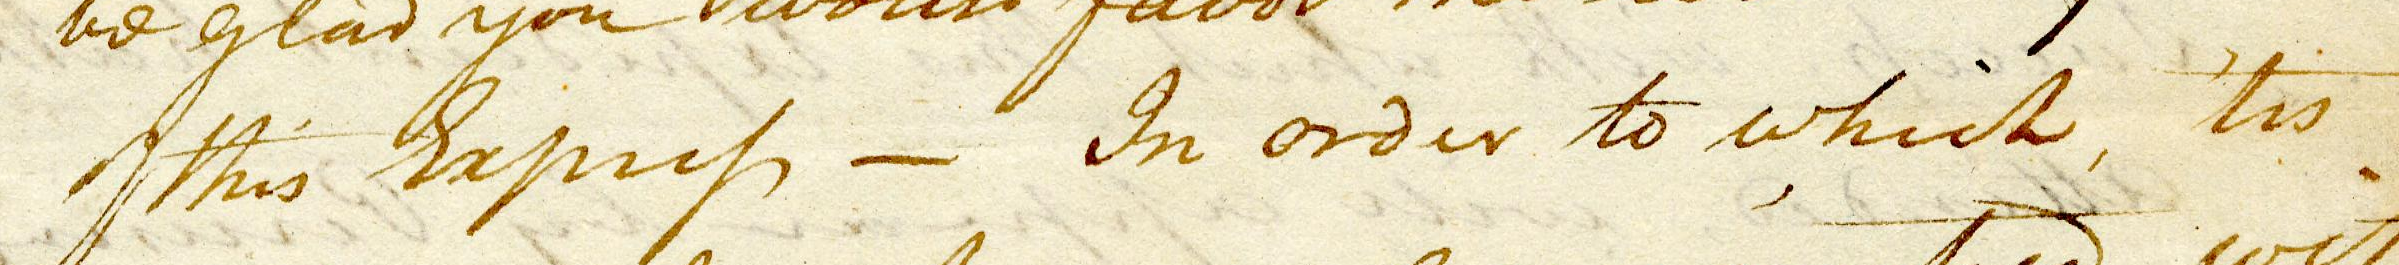of this Express- In order to which, 'tis
